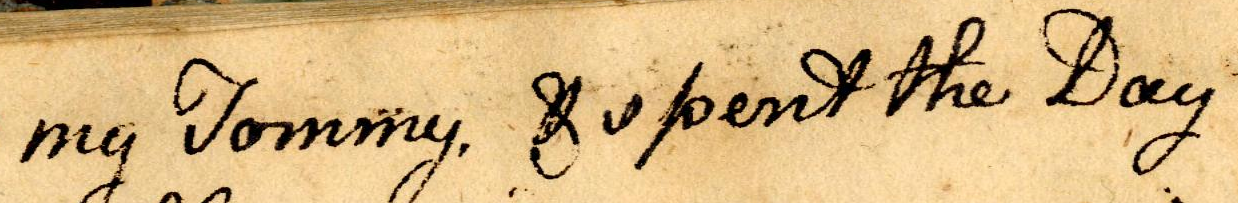my Tommy, & spent the Day
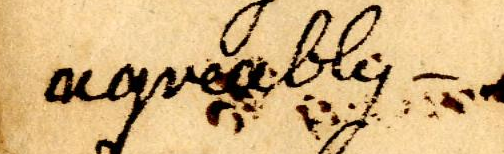agreably-
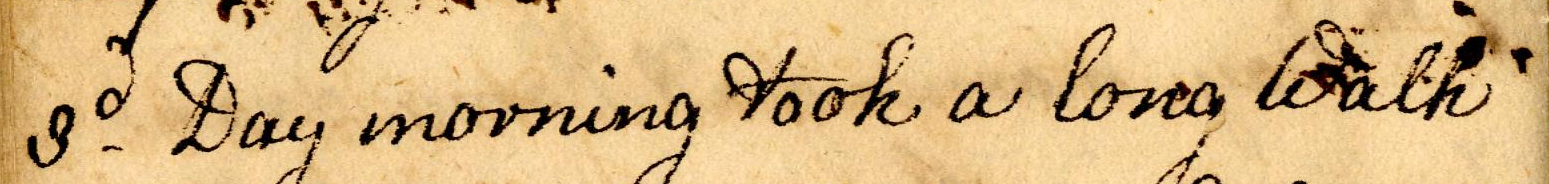3^d. Day morning took a long Walk
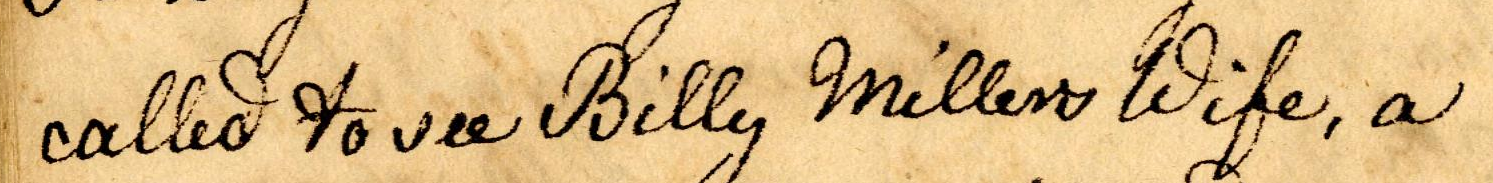called to see Billy Millers Wife, a
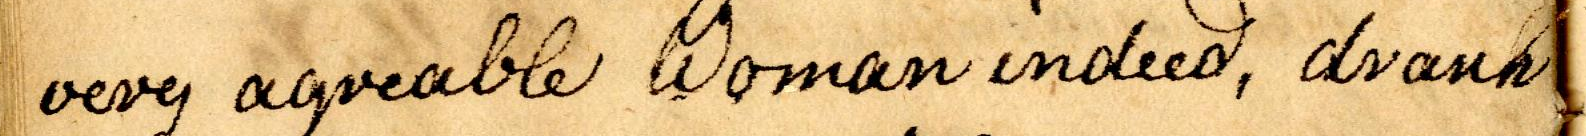very agreable Woman indeed, drank
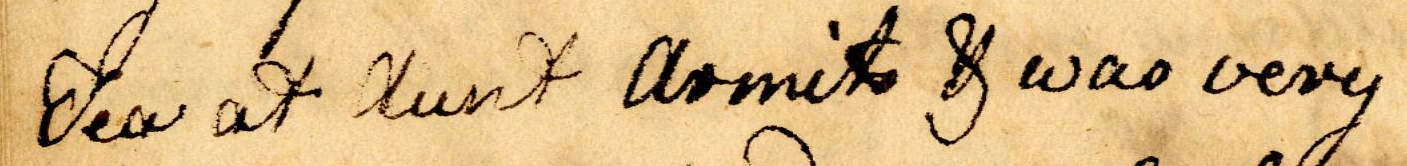Tea at Aunt Armits & was very
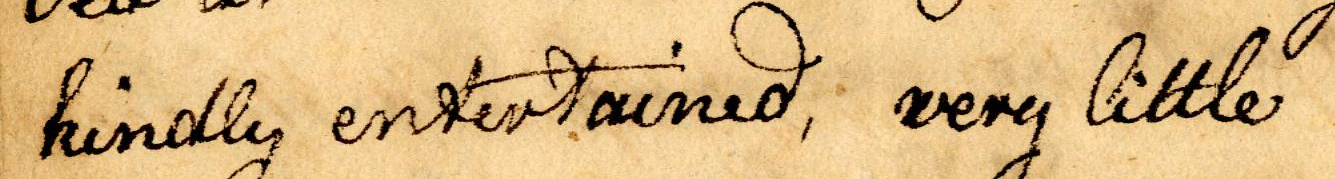kindly entertained, very little
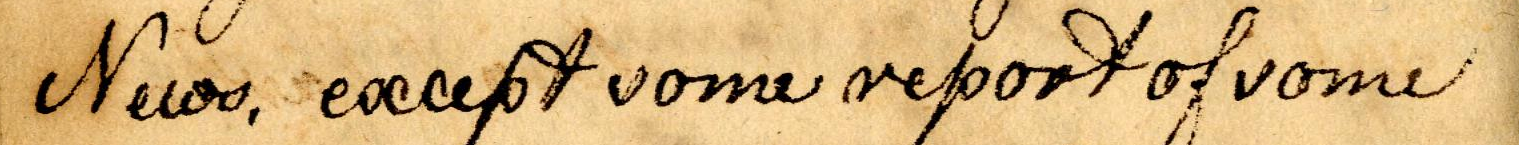News, except some report of some
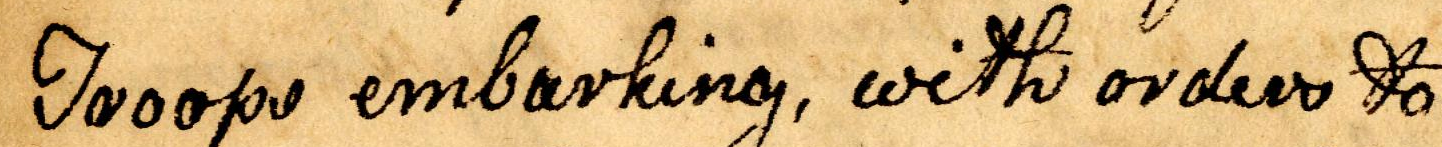Troops embarking, with orders to
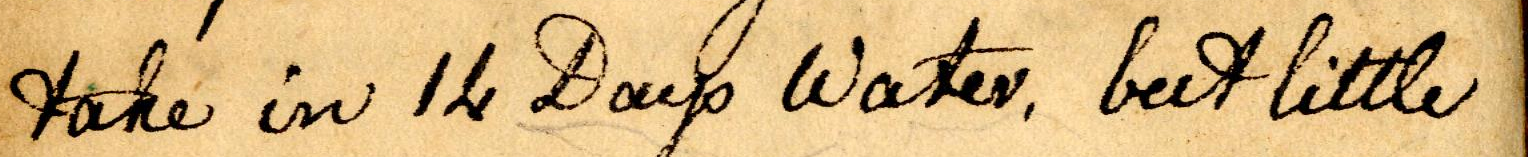take in 14 Days Water, but little
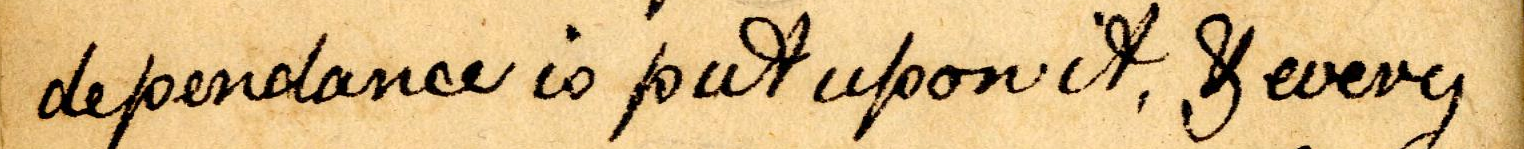dependance is put upon it, & every
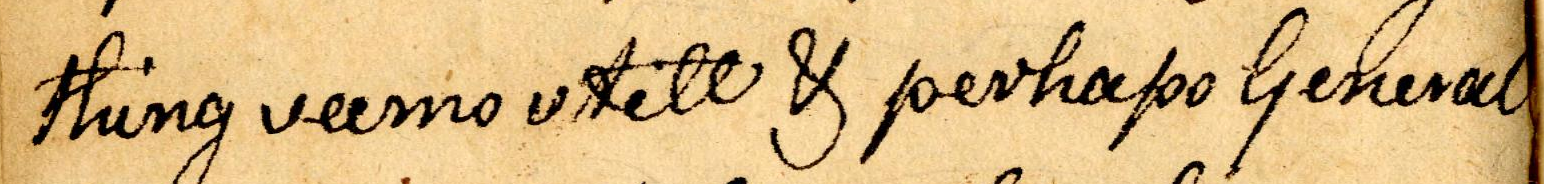thing seems still & perhaps General
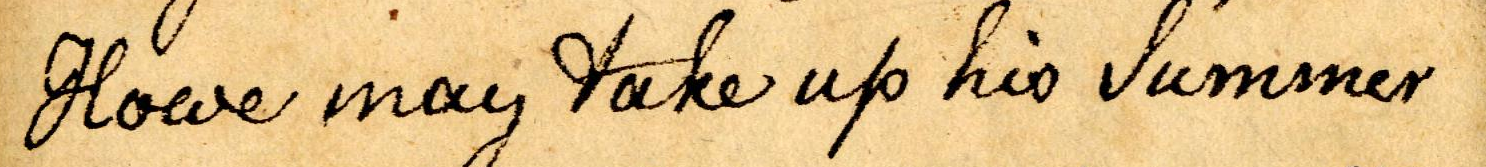Howe may take up his Summer
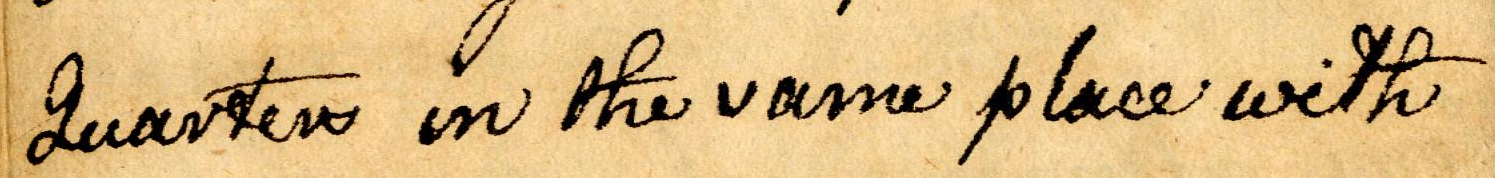Quarters in the same place with
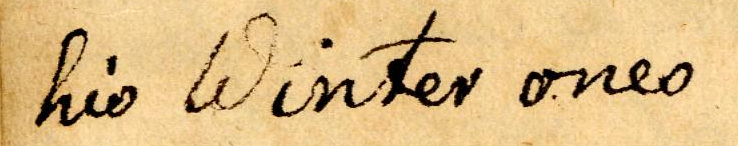his Winter ones
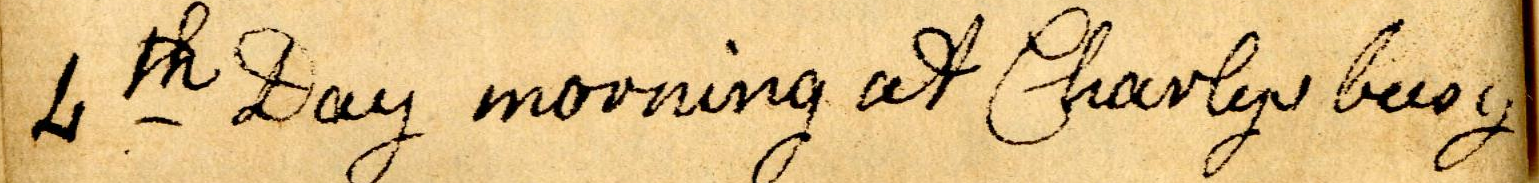4^th Day morning at Charlys busy
